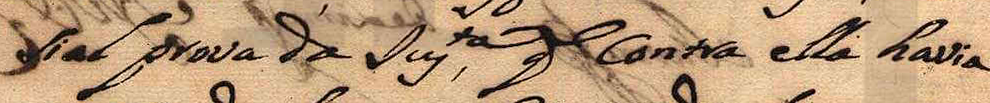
sial prova da Iusta, q̄ contra ella havia
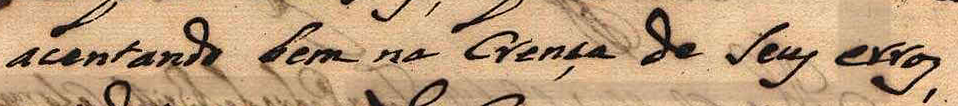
acentando bem na crença de seus erros
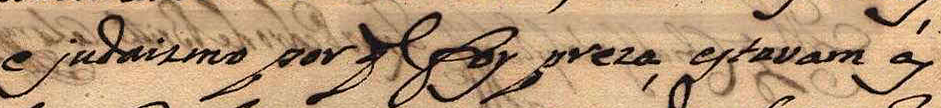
e judaismo por q̄ foy preza, estavam as
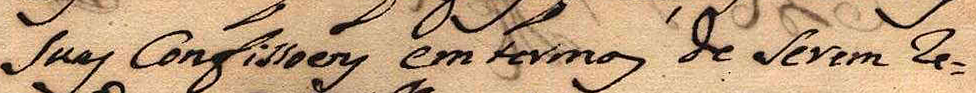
suas Confissoens em termos de serem Re
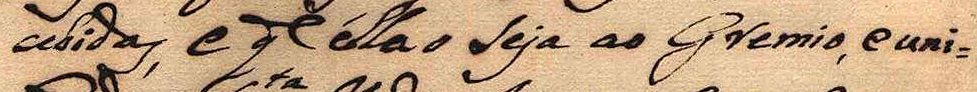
cebidas, e q̄ ella o seja ao Gremio, e uni
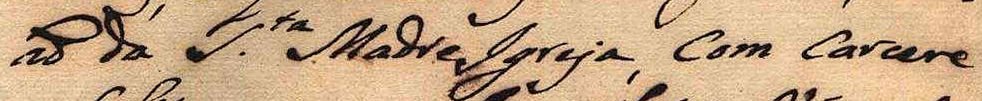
aõ da S.ta Madre Jgreja, com carcere
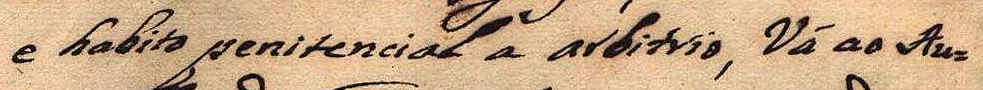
e habito penitencial a arbitrio, Vá ao Au
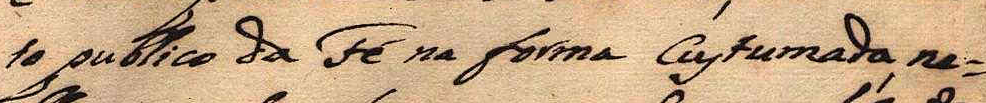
to publico da Fé na forma custumada ne
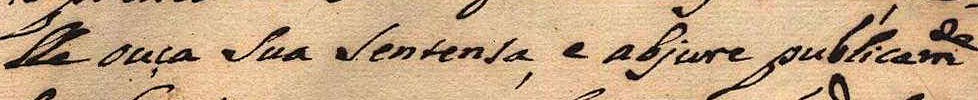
lle ouça sua sentensa, e abjure publicam.te
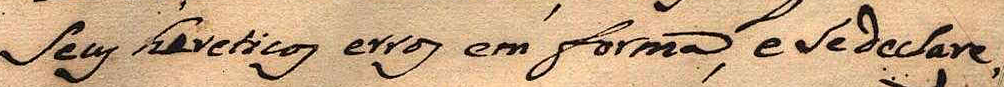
seus hereticos erros em forma, e se declara
